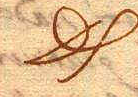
D S
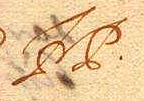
fr P.
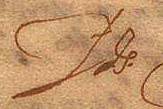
Pds.
